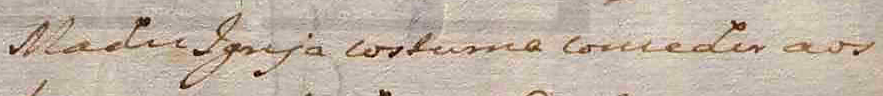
Madre Igreja costuma conceder aos
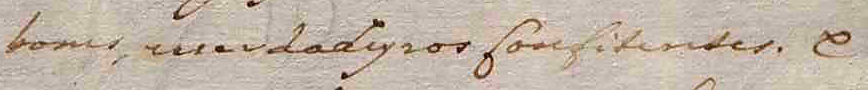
boms, e uerdadeyros Confitentes. e
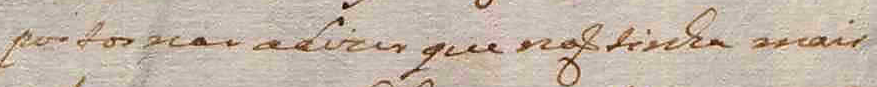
por tornar a dizer que naõ tinha mais
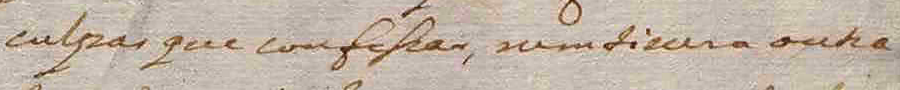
culpas que confessar, nem tiuera outra
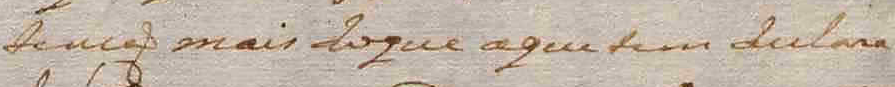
tençaõ mais do que a que tem declara
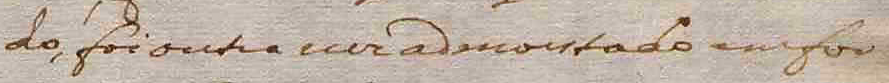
do, foi outra uez admoestado em for
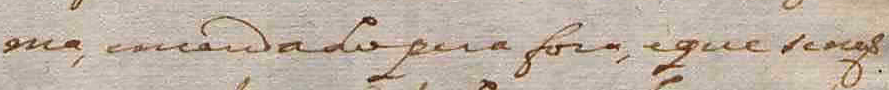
ma, e mandado pera fora, e que se naõ
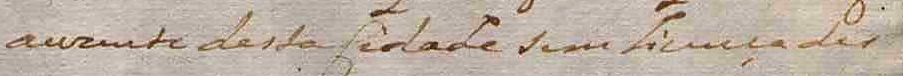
auzente desta Cidade sem Licença des
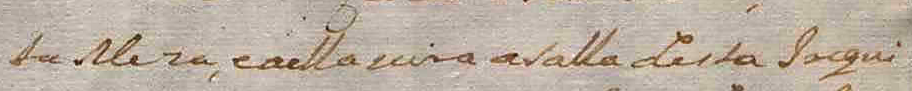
ta Meza, e a ella uira a salla desta Inqui
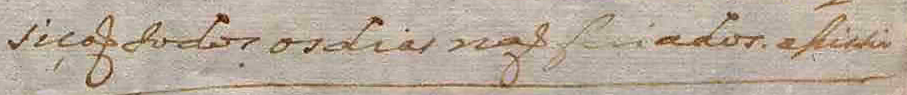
siçaõ todos os dias naõ feriados assistir
